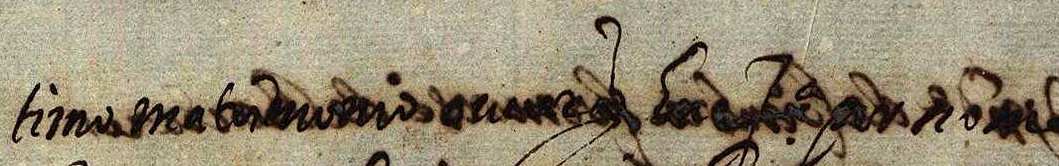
timo matrimonio ouueraõ hua f.a por nome
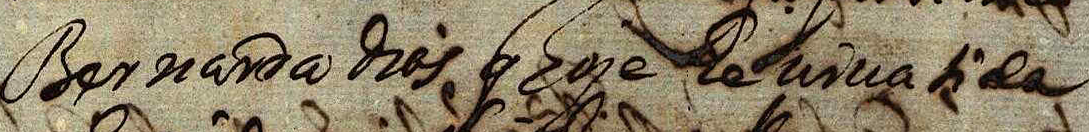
Bernarda dias q̄ hoje he uiua tida
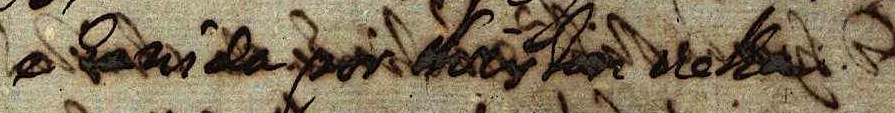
e hauida por christan uelha.
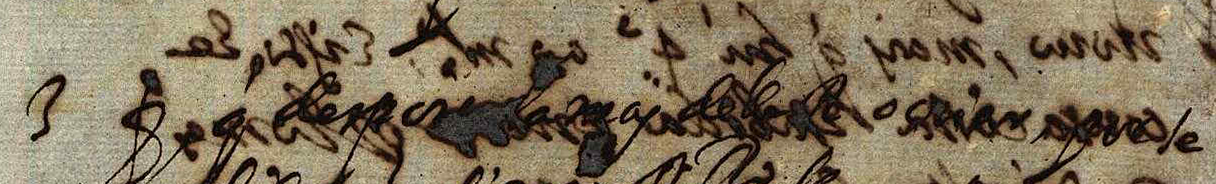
3 ꝓ q̄ despois da maj delle R o criar, por se
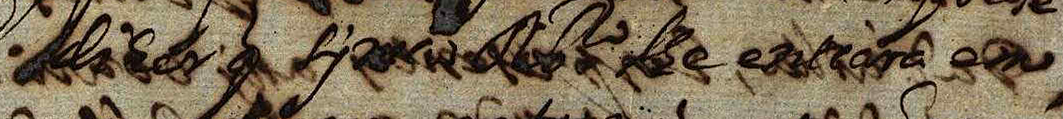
dizer q̄ sjmaõ Ribro lhe entrara em
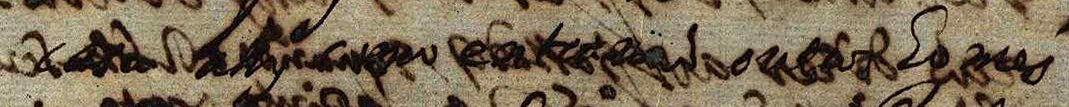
casa assy como entrauaõ outros homēs
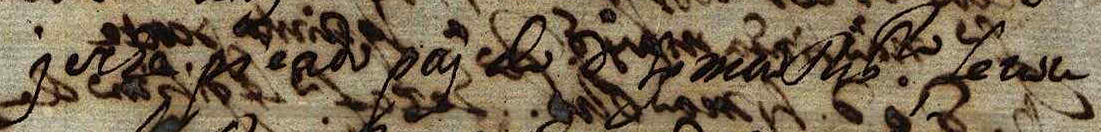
jorhe picado paj do do symaõ Rib.ro leuou
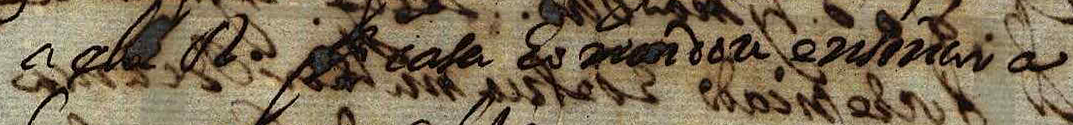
a elle R. pa casa E o mandou ensinar a
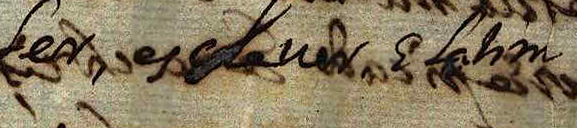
ler, escreuer E latim
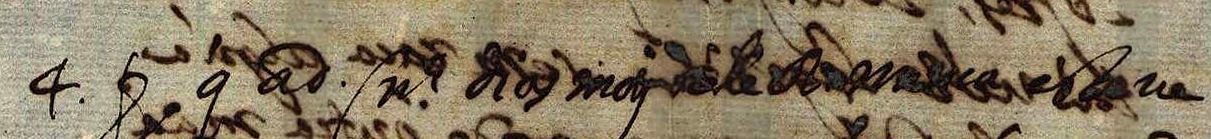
4. ꝓ q̄ a d. Cn.a dias maj delle R. nunca esteue
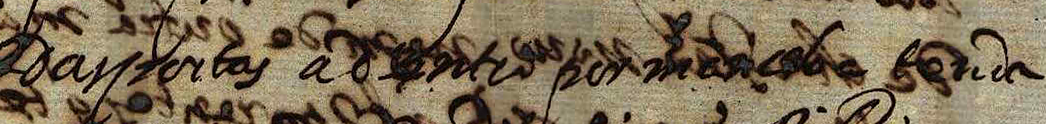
das portas adentro por manceba teuda
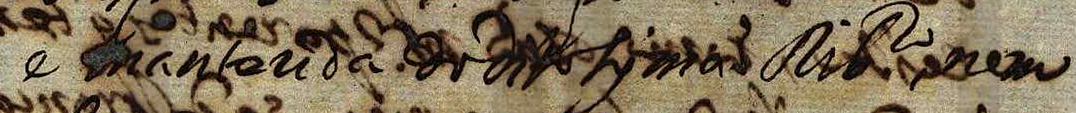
e manteuda do dito symaõ Rib.ro, nem
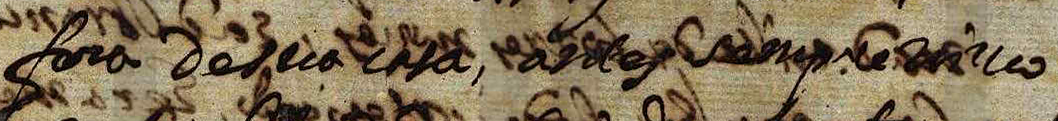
fora de sua casa, antes sempre uiueo
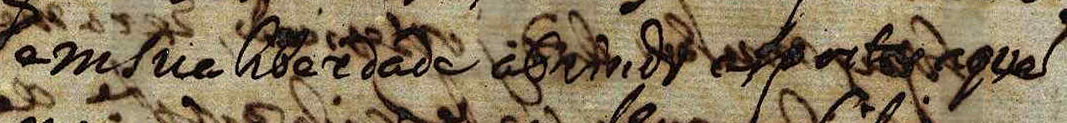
em sua liberdade abrindo as portas a quē
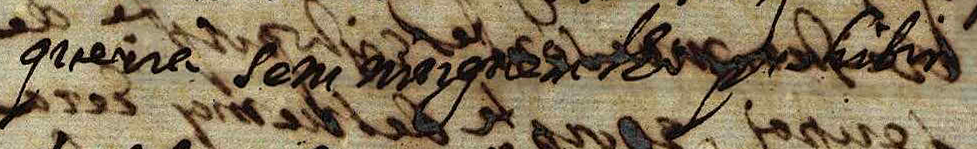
queria sem ninguem lho prohibir
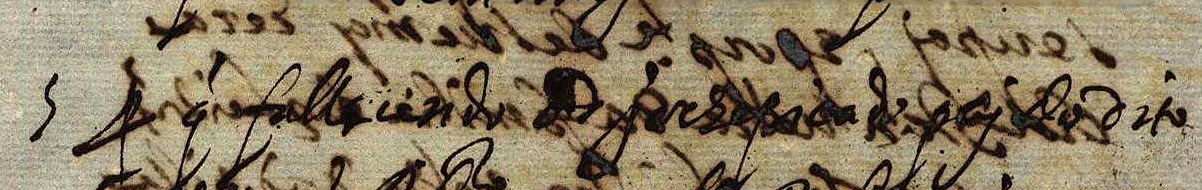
5 ꝓ q̄ fallecendo o d jorhe picado paj do dito
